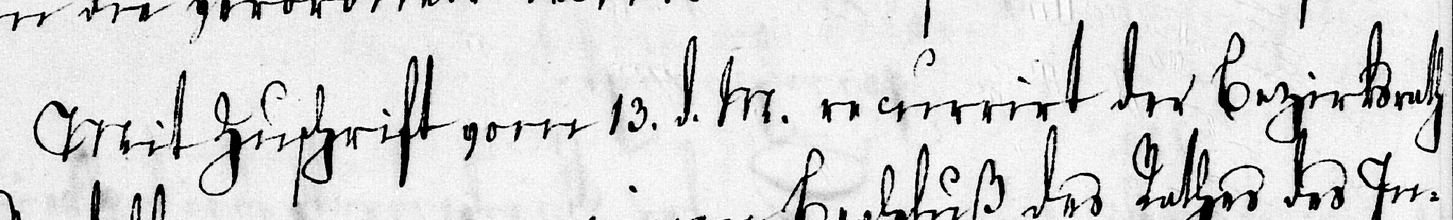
Mit Zuschrift vom 13. d. M. recurirt der Bezirksra¬
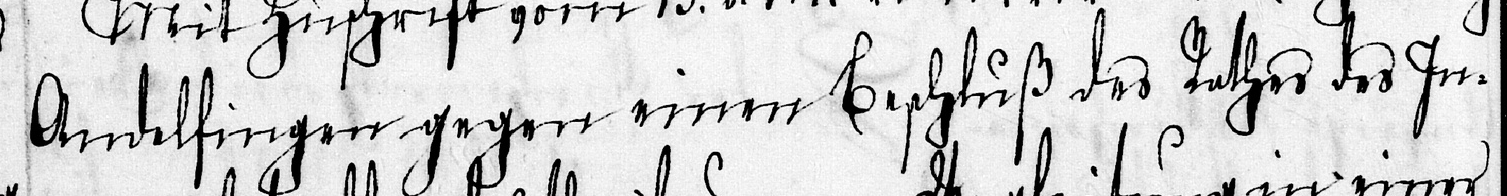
Andelfingen gegen einen Beschluß des Rathes des In¬
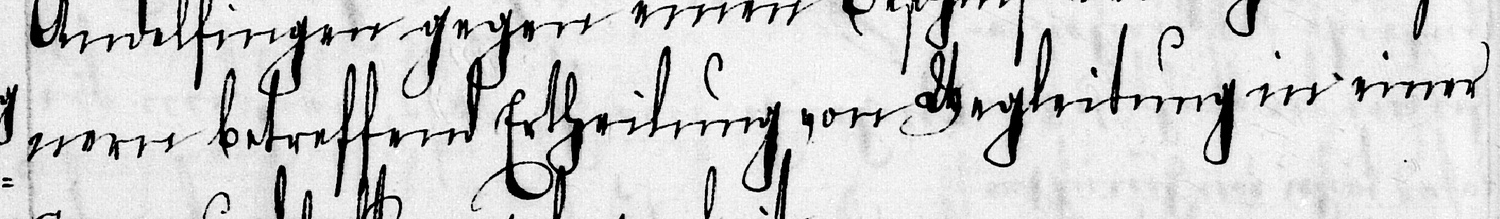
nern betreffend Ertheilung von Wegleitung in einer
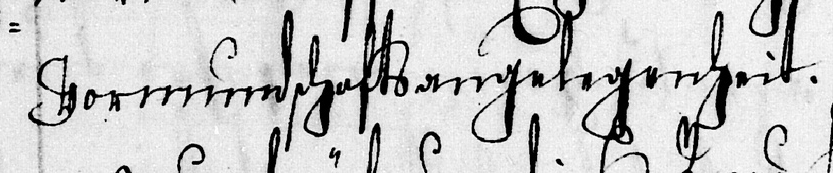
Vormundschaftsangelegenheit.
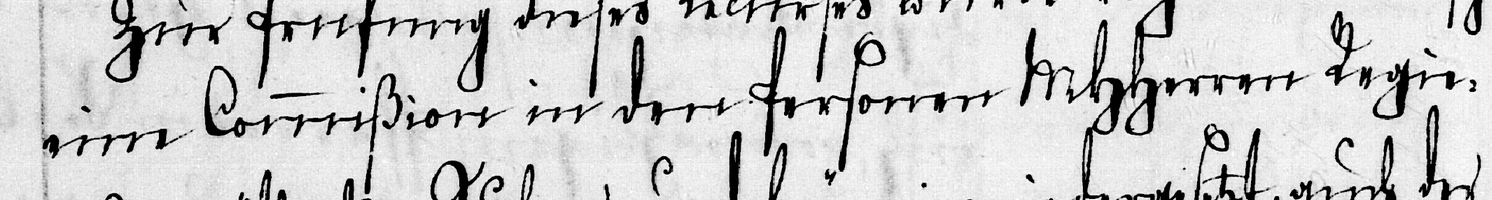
eine Commißion in den Personen MHHerren Regie¬
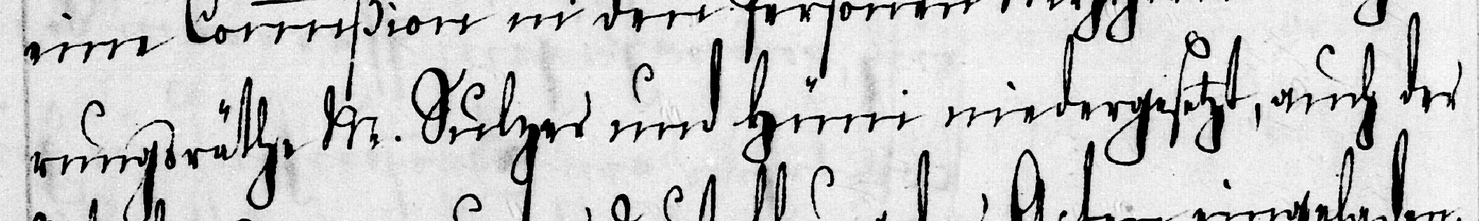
rungsräthe M. Sulzer und Hüni niedergesetzt, auch der
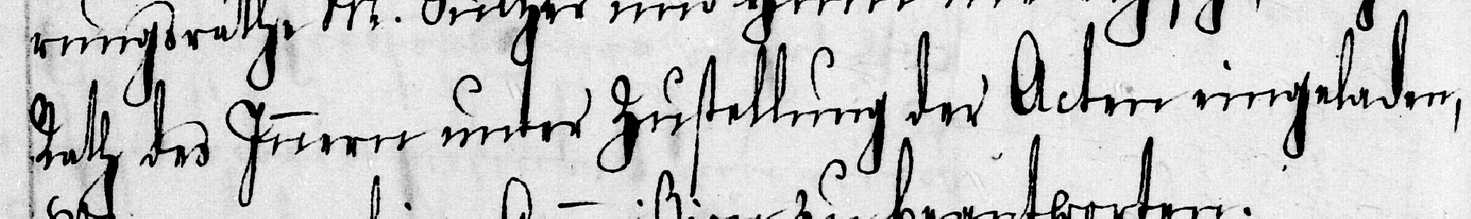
Rath des Innern unter Zustellung der Acten eingeladen,
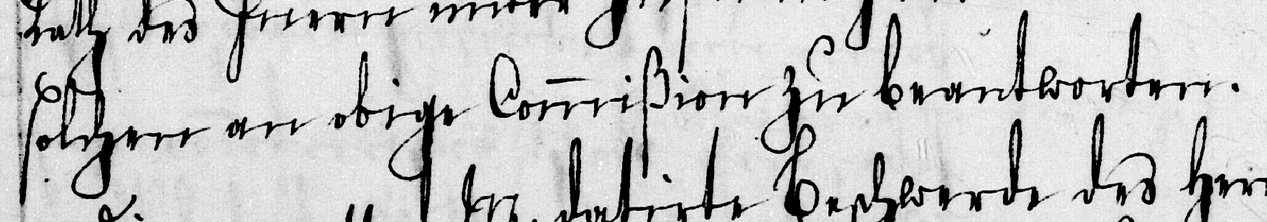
solchen an obige Commißion zu beantworten.
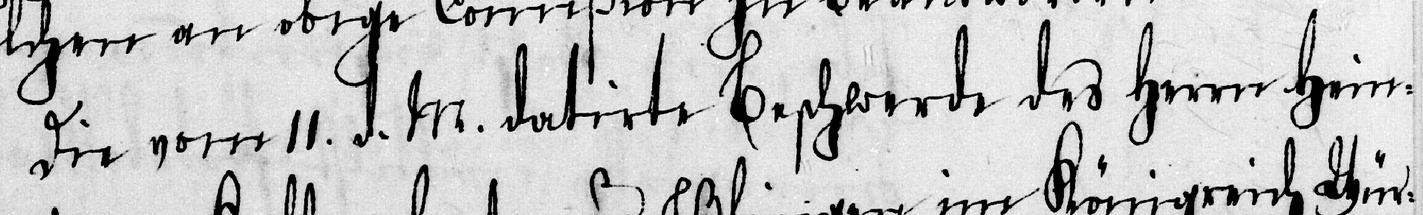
Die vom 11. d. M. datirte Beschwerde des Herrn Hein¬
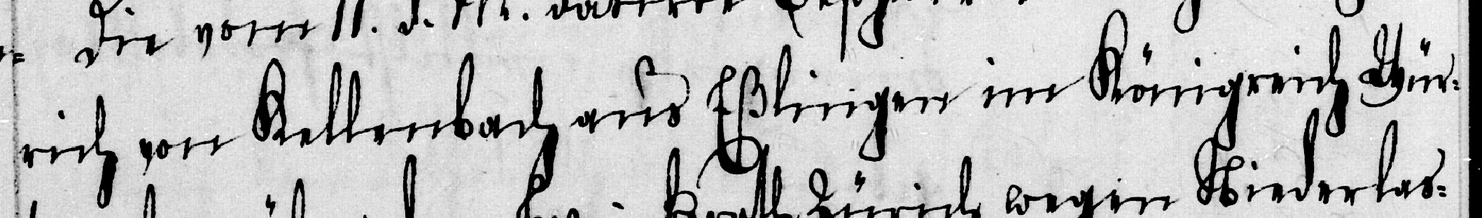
rich von Kellenbach aus Eßlingen im Königreich Wür¬
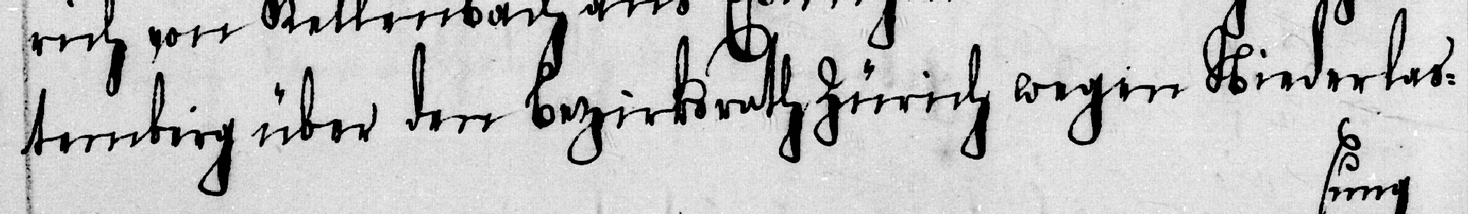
temberg über den Bezirksrath Zürich wegen Niederlas-
